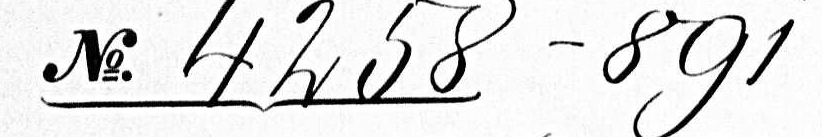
No. 4258 - 1891
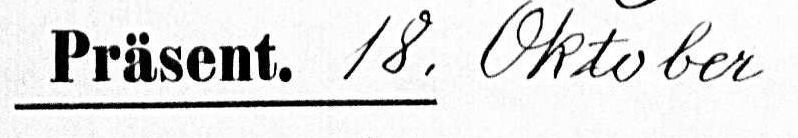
Präsent. 18. Oktober
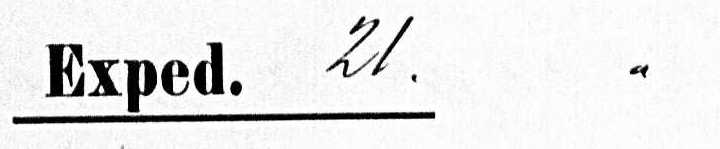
Exped. 21. „
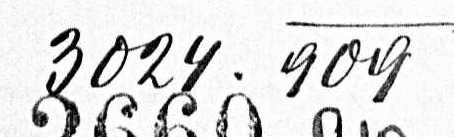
3024-1909
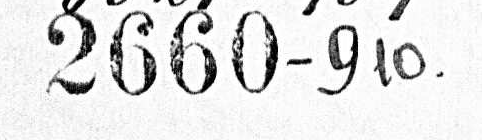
2660-1910
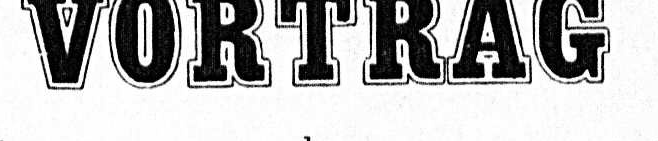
VORTRAG
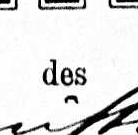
des
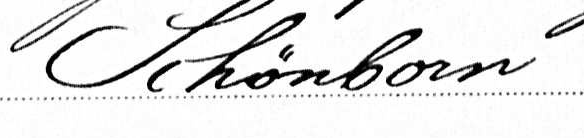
Schönborn
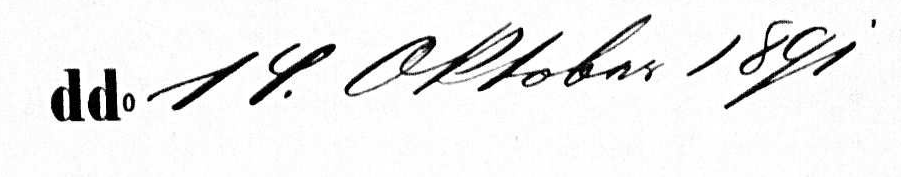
ddo 14. Oktober 1891
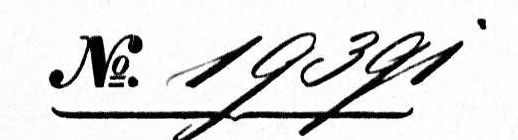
No. 19391
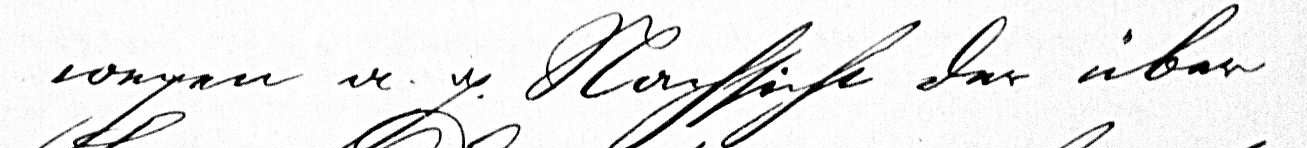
wegen a.g. Nachsicht der über
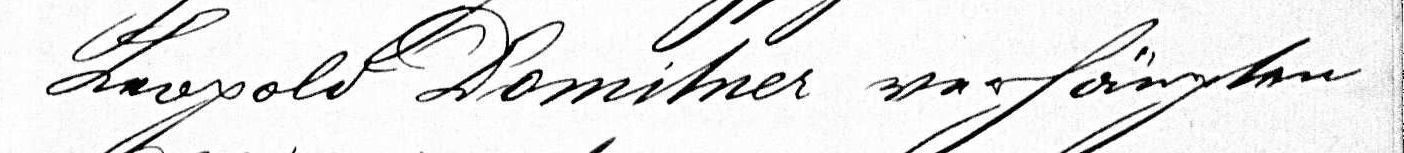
Leopold Domitner verhängten
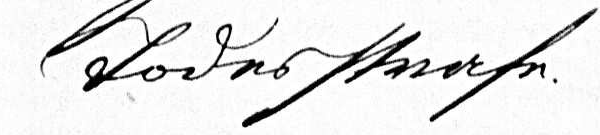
Todesstrafe.
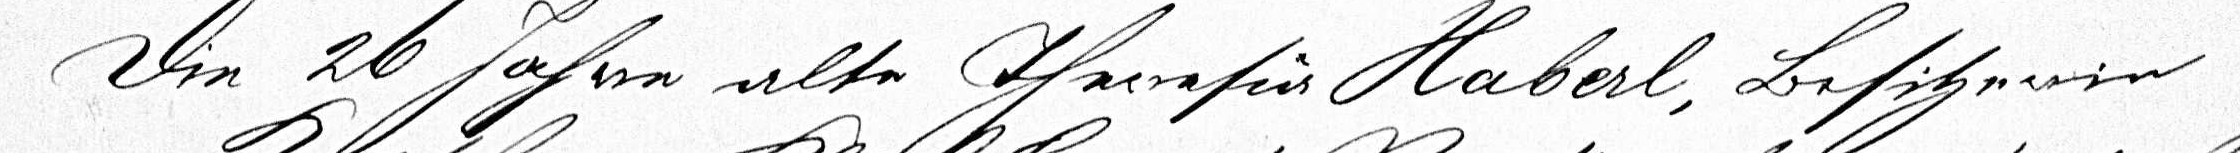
Die 26 Jahre alte Theresia Haberl, Besitzerin
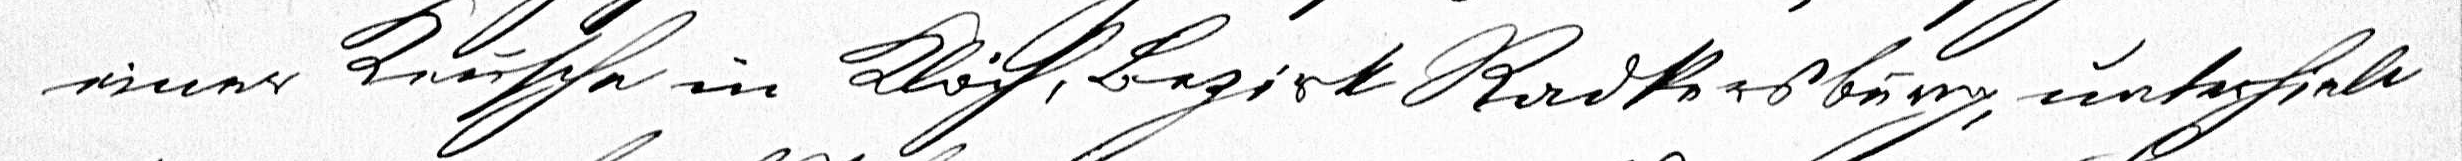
einer Keusche in Klöch, Bezirk Radkersburg, unterhielt
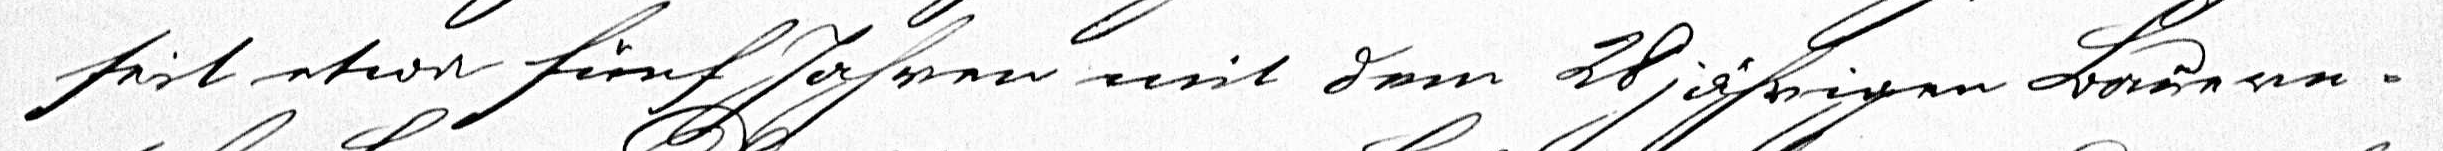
seit etwa fünf Jahren mit dem 28jährigen Bauern¬
